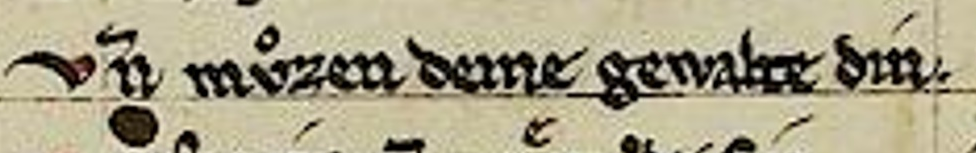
Vn(d) mv°ozen deme gewalte din.
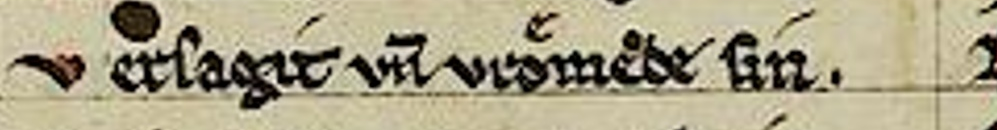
Verſagit vn(d) vro°emede ſin.
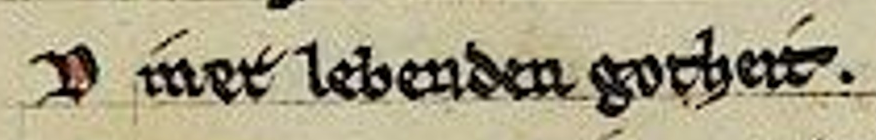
Diner lebenden gotheit.
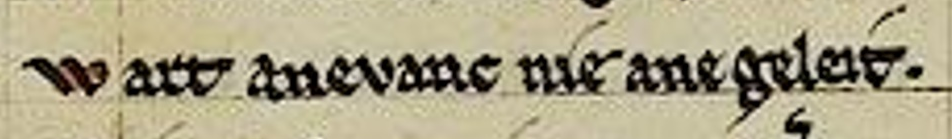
Wart anevanc nie ane geleit.
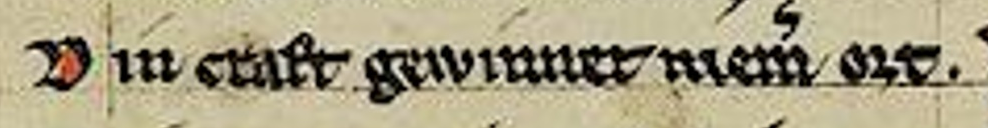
Din craft gewinnet niem(er) ort.
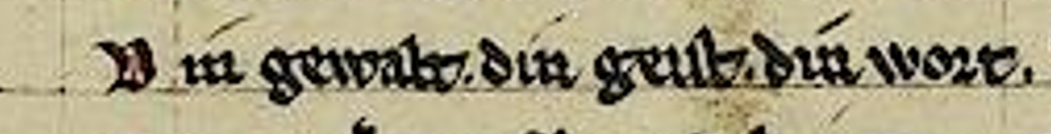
Din gewalt. din geiſt. din wort.
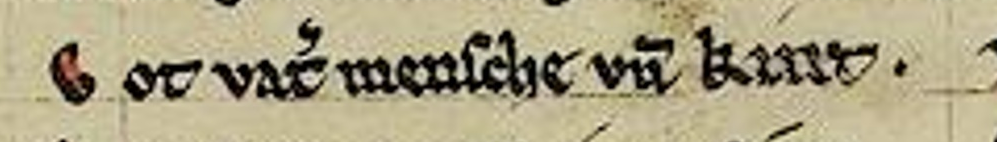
Got vat(er) menſche vn(d) kint.
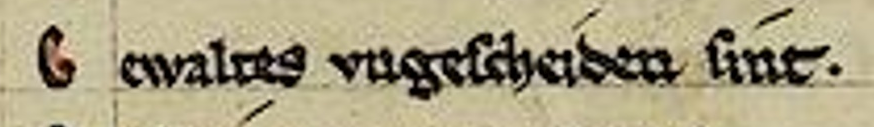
Gewaltes vngeſcheiden ſint.
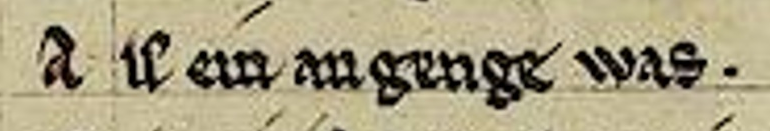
Als ein an genge was.
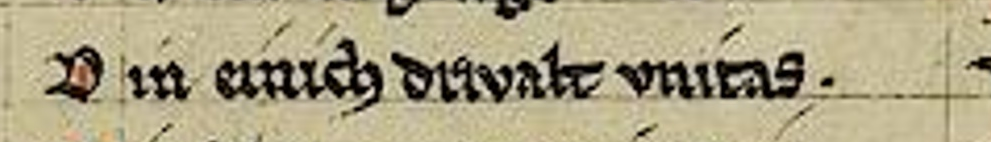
Din einich drivalt vnitas.
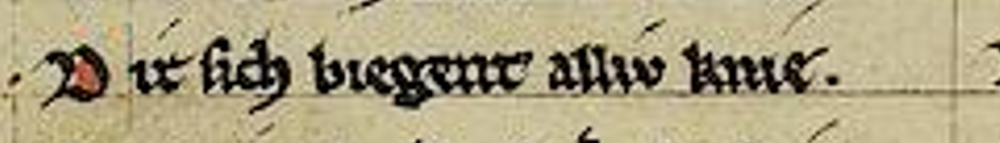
Dir ſich biegent alliv knie.
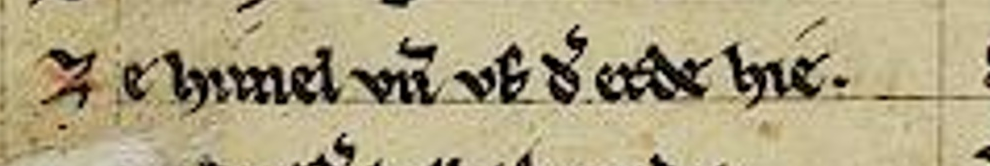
Ze himel vn(d) vf d(er) erde hie.
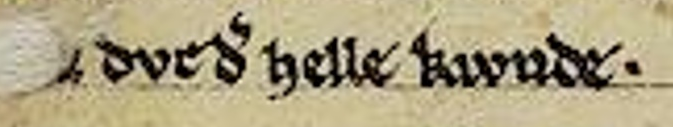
xxx dvr d(er) helle kwnde.
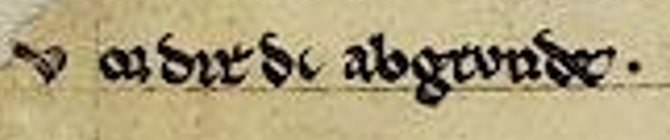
Vor dir d(az) abgrunde.
